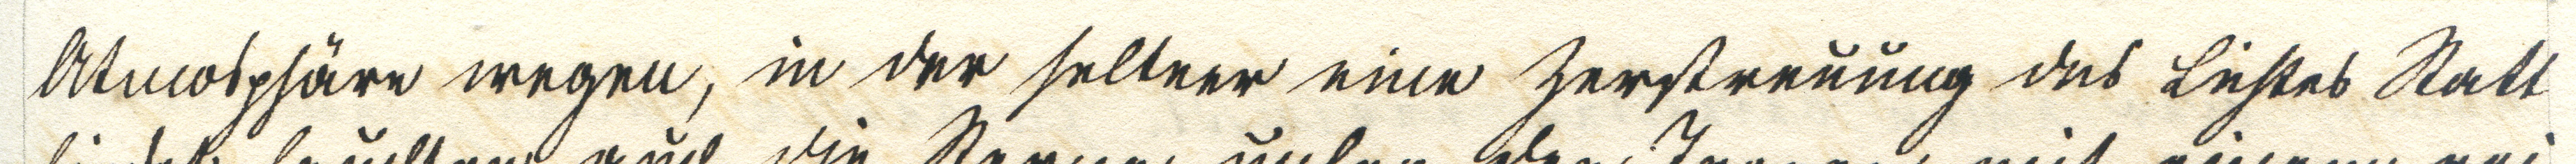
Atmosphäre wegen, in der seltner eine Zerstreuung des Lichtes Statt
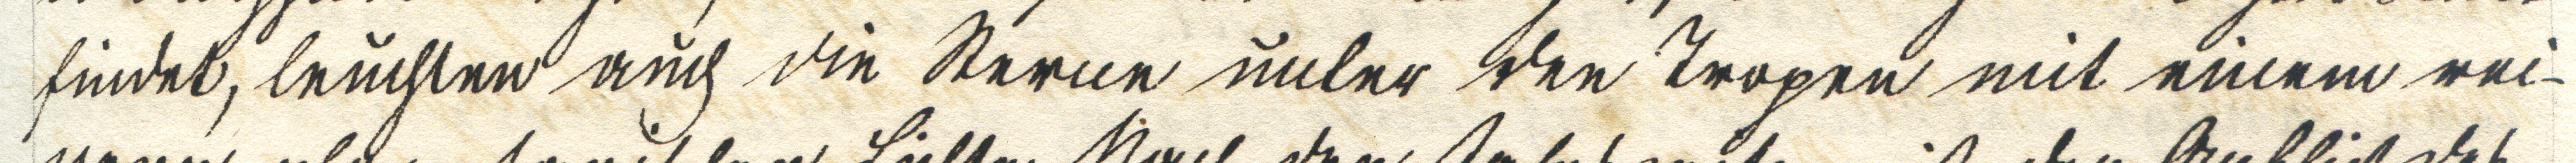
findet, leuchten auch die Sterne unter den Tropen mit einem rei-
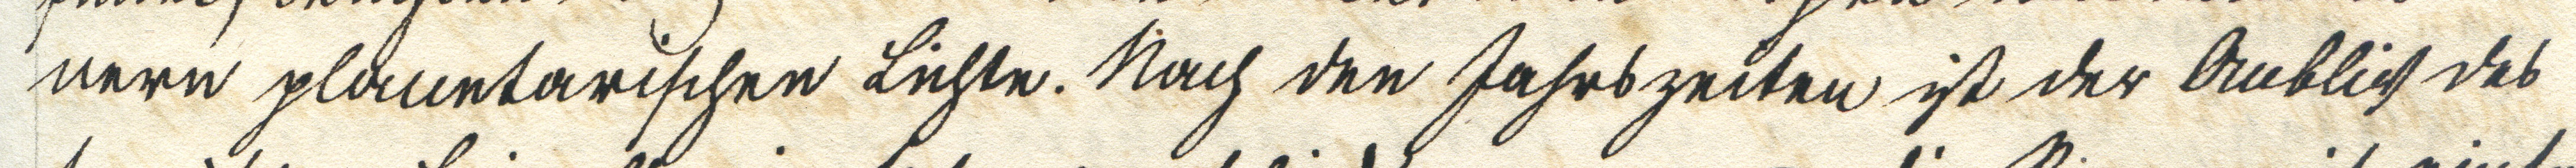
nern planetarischen Lichte. Nach den Jahreszeiten ist der Anblick des
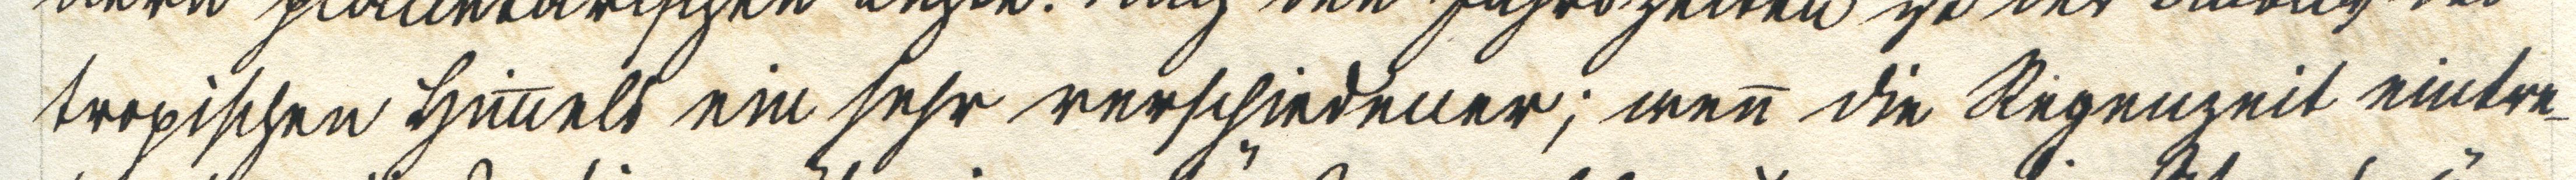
tropischen Him̃els ein sehr verschiedener; weñ die Regenzeit eintre-
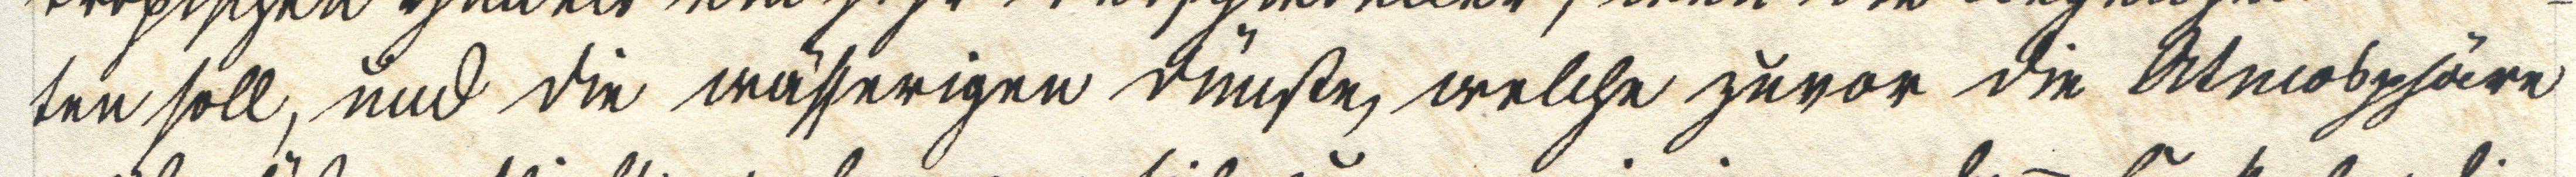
ten soll, und die wässerigen Dünste, welche zuvor die Atmosphäre
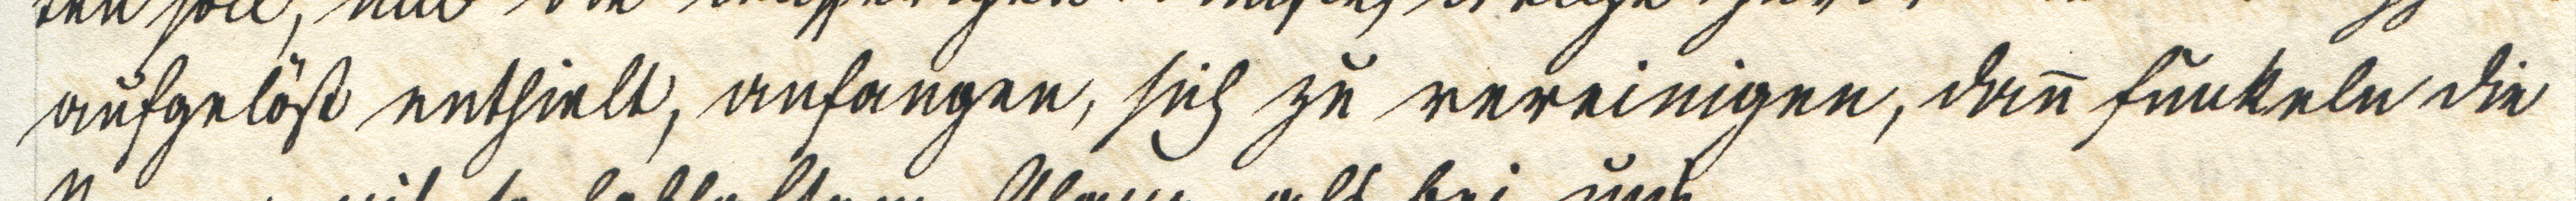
aufgelöst enthielt, anfangen, sich zu vereinigen, dañ funkeln die
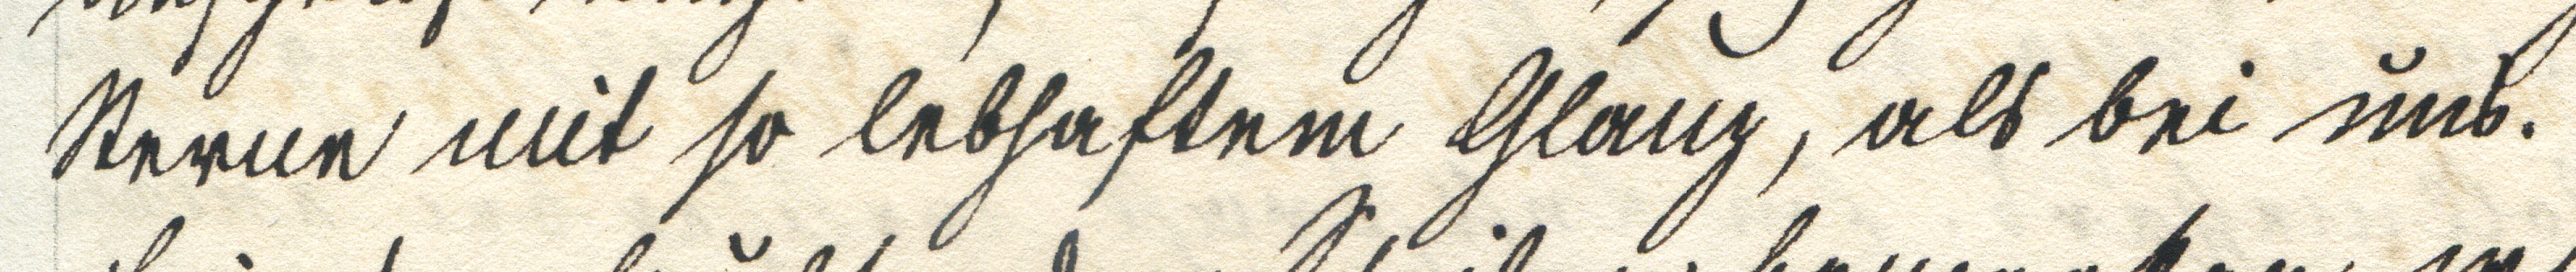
Sterne mit so lebhaftem Glanz, als bei uns.
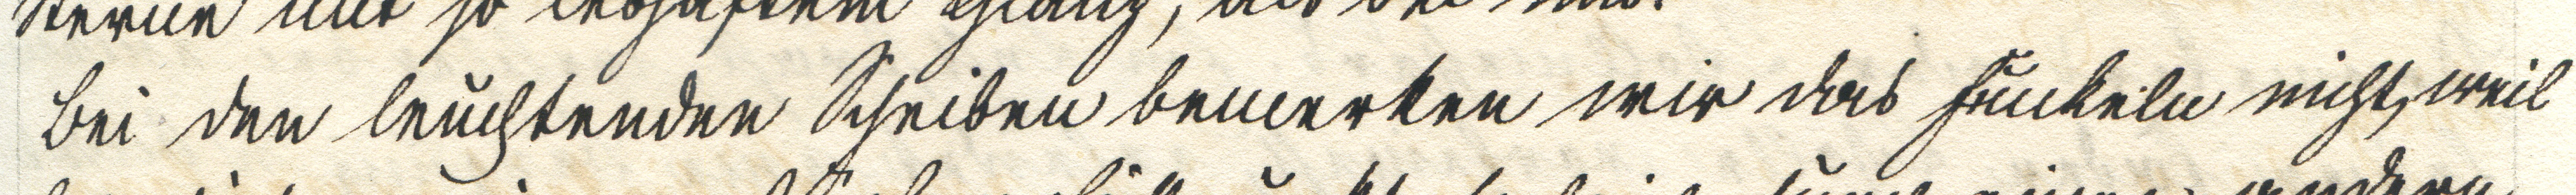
Bei den leuchtenden Scheiben bemerken wir das Funkeln nicht, weil
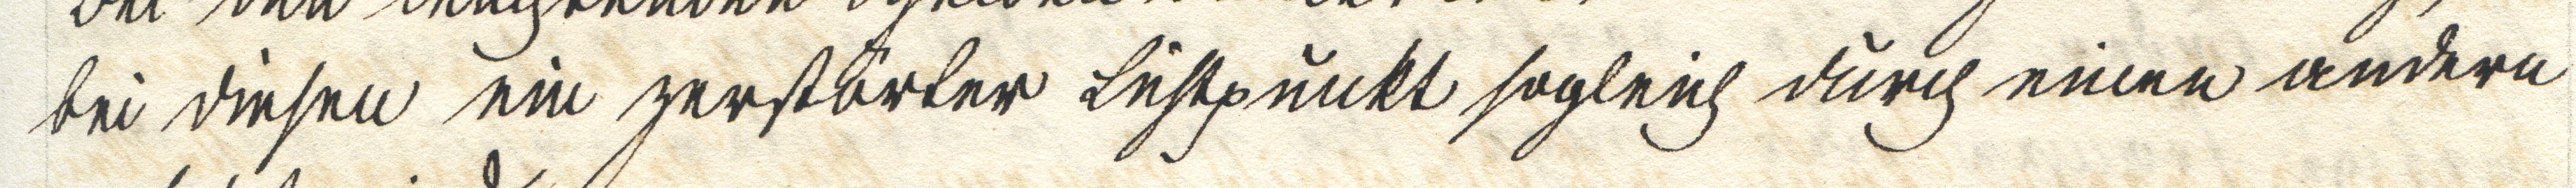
bei diesen ein zerstörter Lichtpunkt sogleich durch einen andern
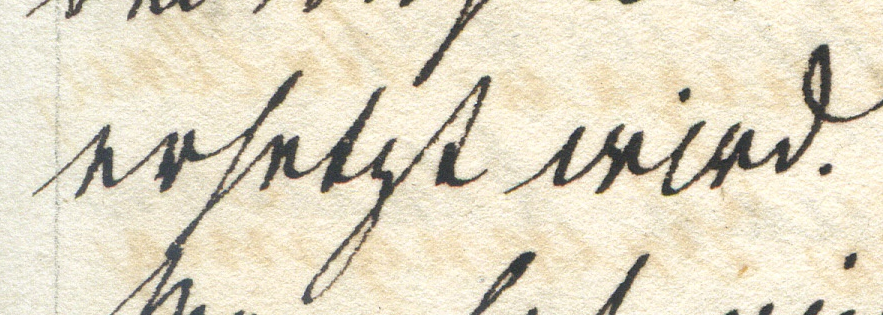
ersetzt wird.
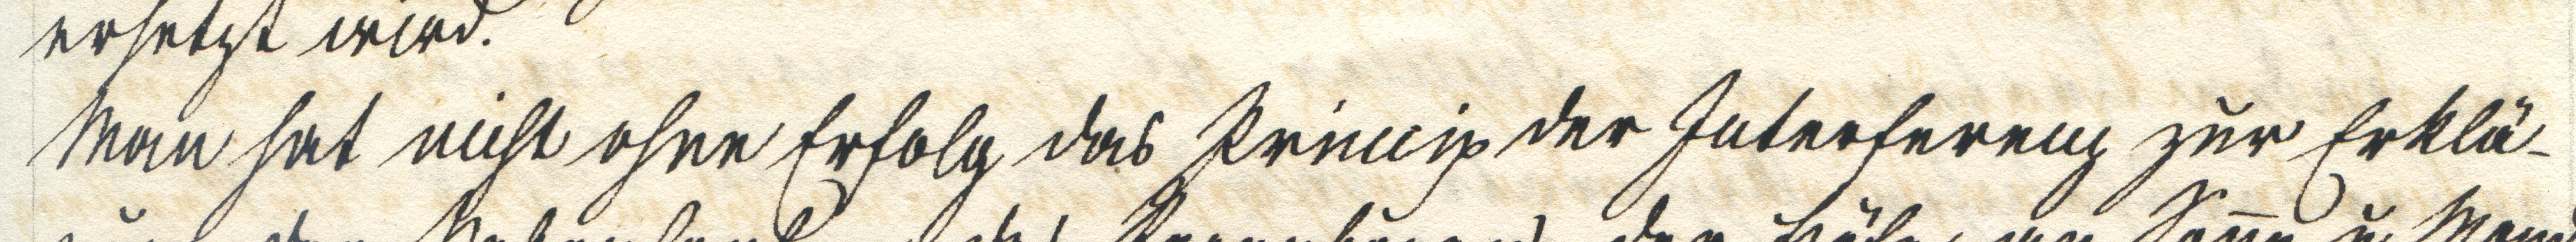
Man hat nicht ohne Erfolg das Princip der Interferenz zur Erklä-
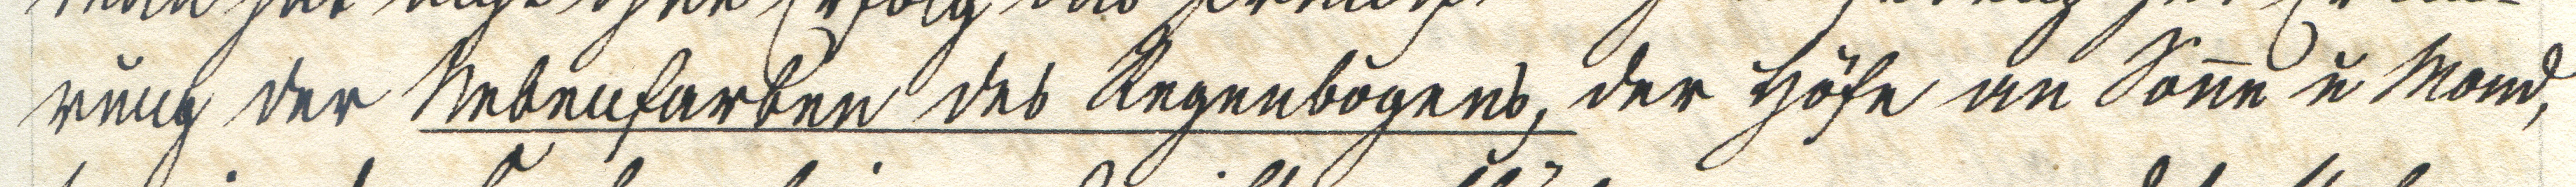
rung der Nebenfarben des Regenbogens, der Höfe an Soñe u Mond,
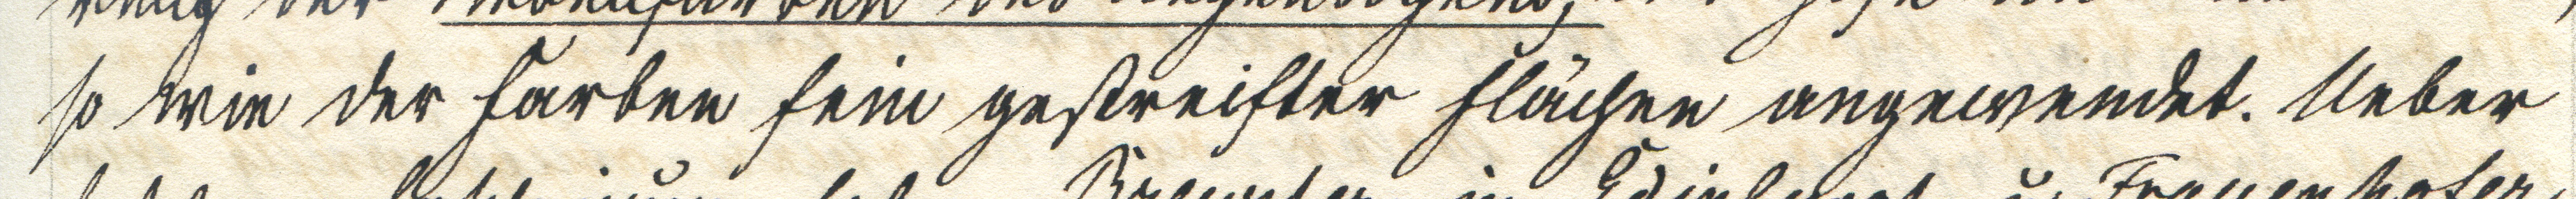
so wie der Farben fein gestreifter Flächen angewendet. Ueber
